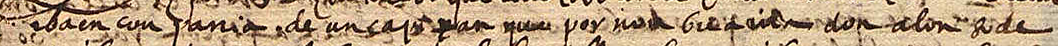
iba en compania de un capitan que por nombre auia don alonso de
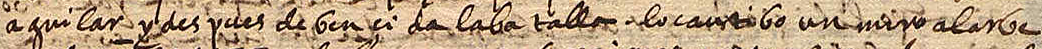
aguilar y despues de vencida la batalla lo cautivo un moro alarve
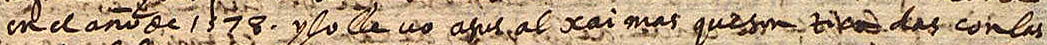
en el an̄o de 1578. y lo lleuo a sus alxaimas que son tiradas con las
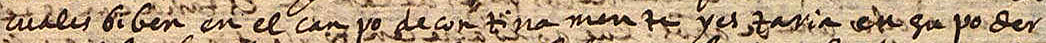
cuales biben en el canpo de continamente y estaria en su poder
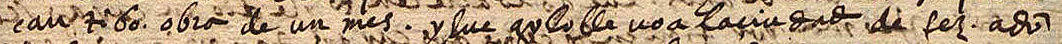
cautivo obra de un mes. y luego lo lleuo a la ciudad de fez. adō
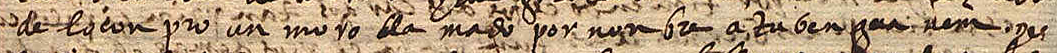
de lo conpro un moro llamado por nonbre atuven guanem y es
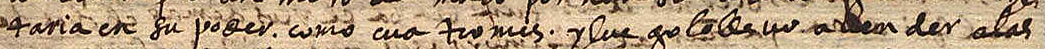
taria en su poder como cuatro mes y luego lo lleuo a uender a las
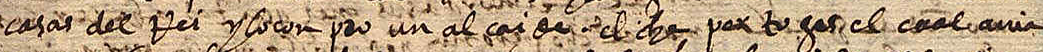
casas del Rei y lo conpro un alcaide elche portoges el coal auia
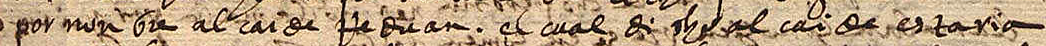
por nonbre alcaide Reduan. el cual dicho alcaide estaria
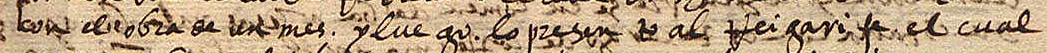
con el obra de un mes. y luego lo presento al Rei garife el cual
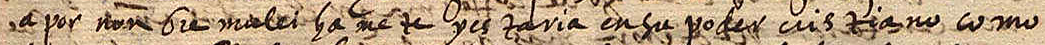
a por nonbre mulei hamete y estaria en su poder cristiano como
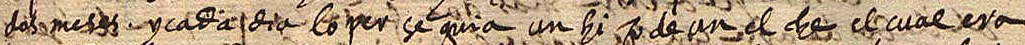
dos meses y cada dia lo perseguia un hijo de un elche el cual era
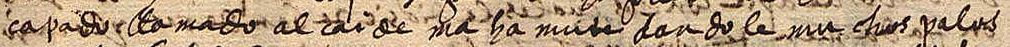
capado llamado alcaide mahamute dando le muchos palos
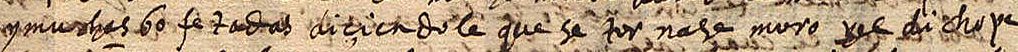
y muchas bofetadas diciendo le que se tornase moro y el dicho pe
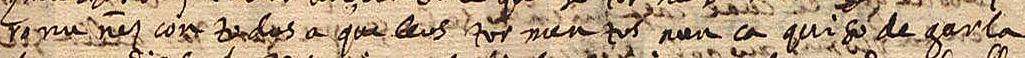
ro nun̄ez con todos aquellos tormentos nunca quiso degar la
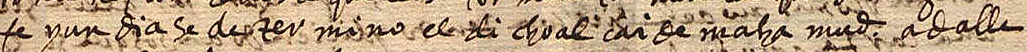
fe y un dia se determino el dicho alcaide mahamud a dalle
